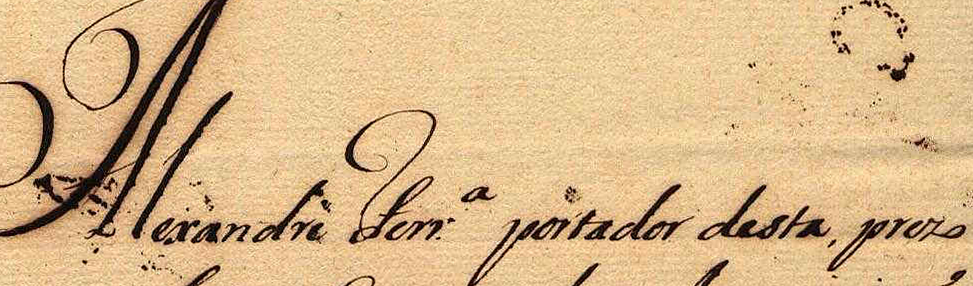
Alexandre Ferr.a portador desta, prezo
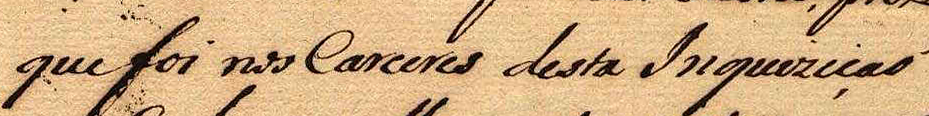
que foi nos Carceres desta Inquiziçaõ
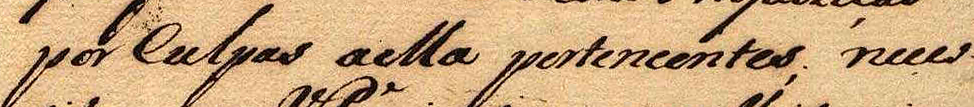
por Culpas a ella pertencentes; neces
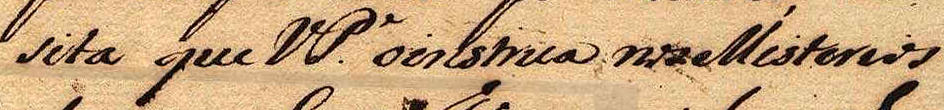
sita que V P.e o instrua nos Misterios
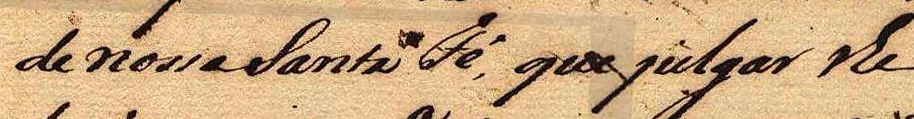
de nossa Santa Fé, que julgar lhe
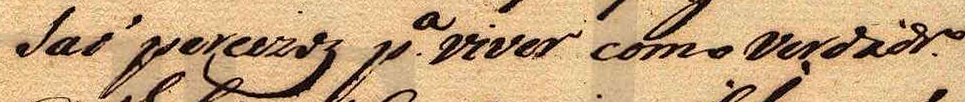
saõ percizos p.a viver como verdadr.o
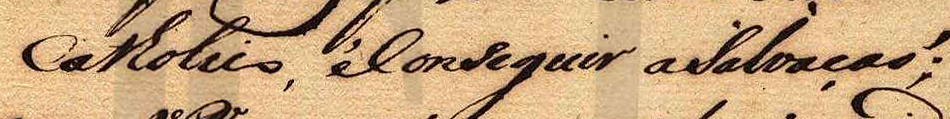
Catholico, e Conseguir a Salvaçaõ;
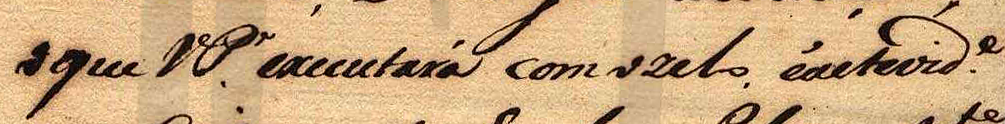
o que V P.e executara com o zelo, e actevid.e
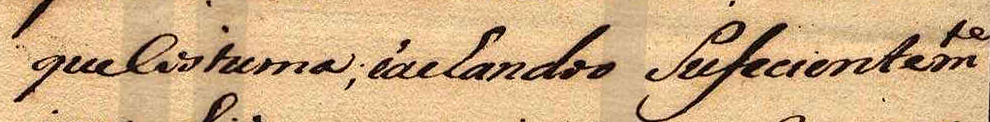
que Costuma; e achandoo Sufecientem.te
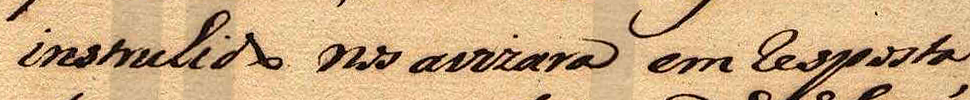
instruhido nos avizara em Resposta
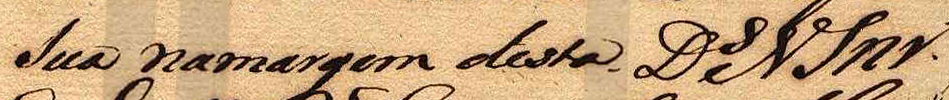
sua na margem desta. Ds N Snr̄.
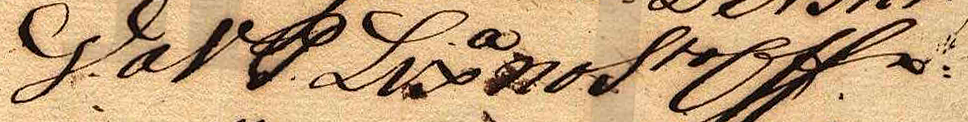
G.e a V P. Lix.a no S.to Off.o:
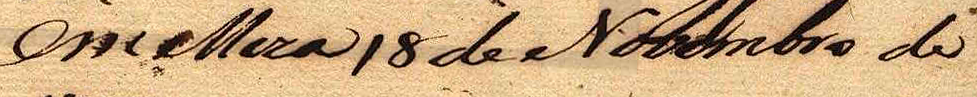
em Meza 18 de Novembro de
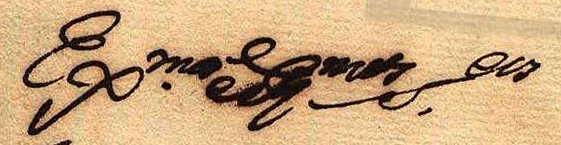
Ex.mo e R.mos S.es
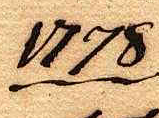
1778
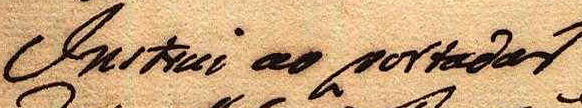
Instrui ao portadar
